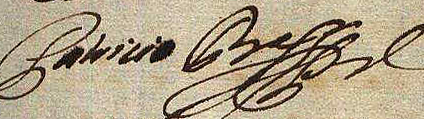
Patricio Pra
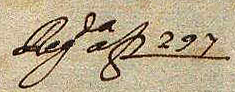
Regda a fL 297
